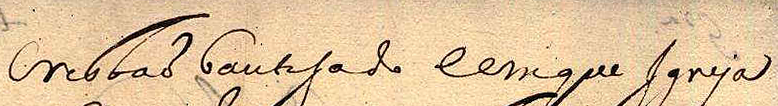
cristaõ bautisado, e em que Jgreja
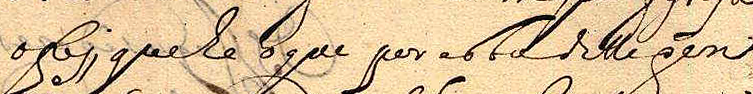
o foj, que he o que por esta dillegen
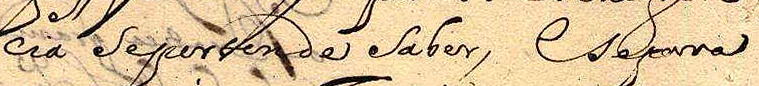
cia se pertende saber, E se para
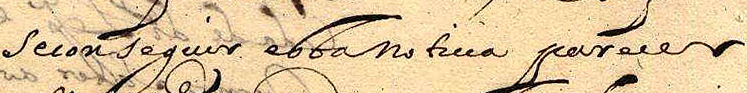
se conseguir esta noticia parecer
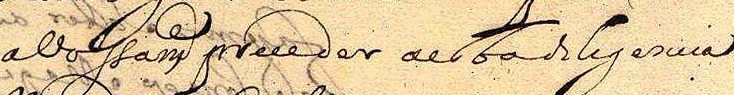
a Vossa mce preceder a esta diligencia
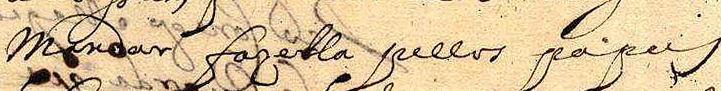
Mandar fazella pellos papeis
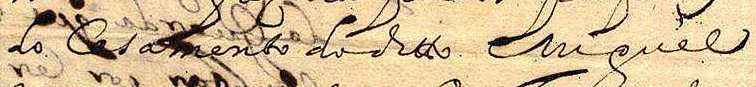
do Casamento do ditto Miguel
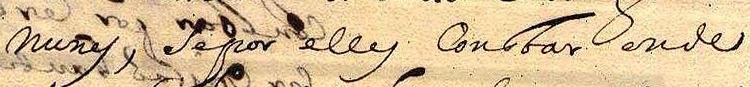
nunes, se por elles constar, onde
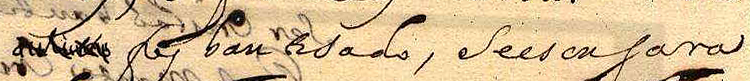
o ditto foy bautisado, se escusara
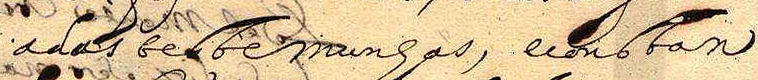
a das testemunhas, e constan
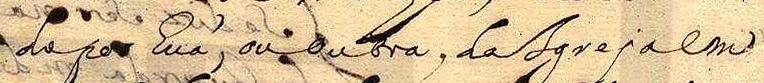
do por huā, ou outra, da Igreja em
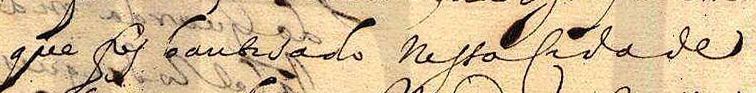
que foj bautisado nesta Cidade
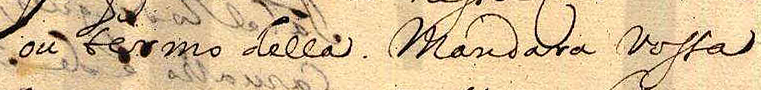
ou termo della. Mandara vossa
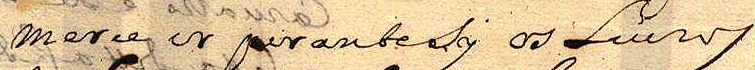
merce ir perante sy os Liuros
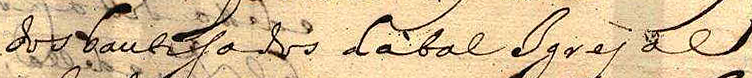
dos bautisados da tal Igreja e
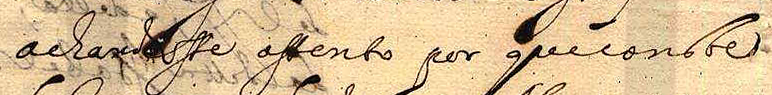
achandosse assento porque conste
